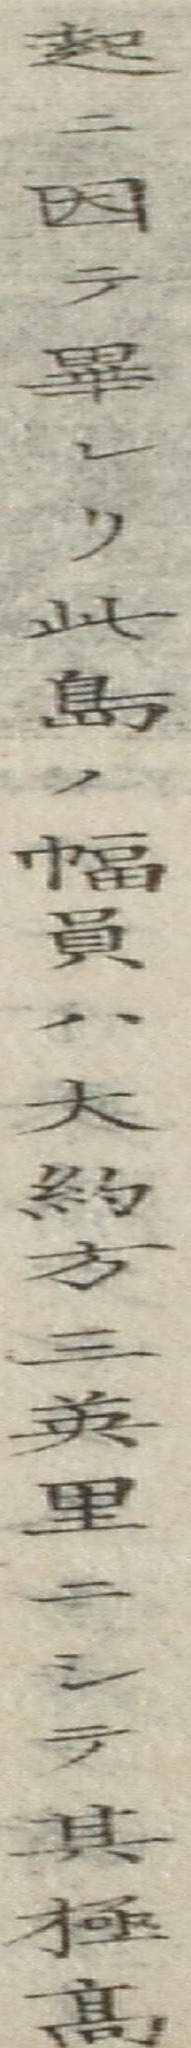起ニ因テ畢レリ此島ノ幅員ハ大約方三英里ニシテ其極高
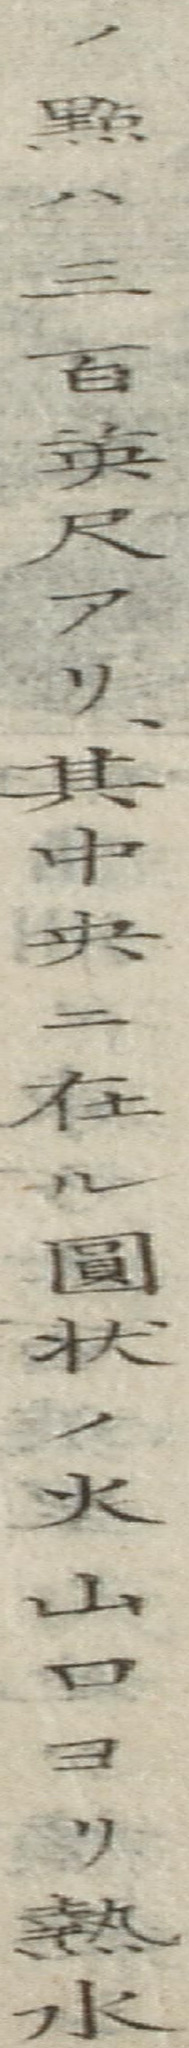ノ点ハ三百英尺アリ、其中央ニ在ル円上ノ火山口ヨリ熱水
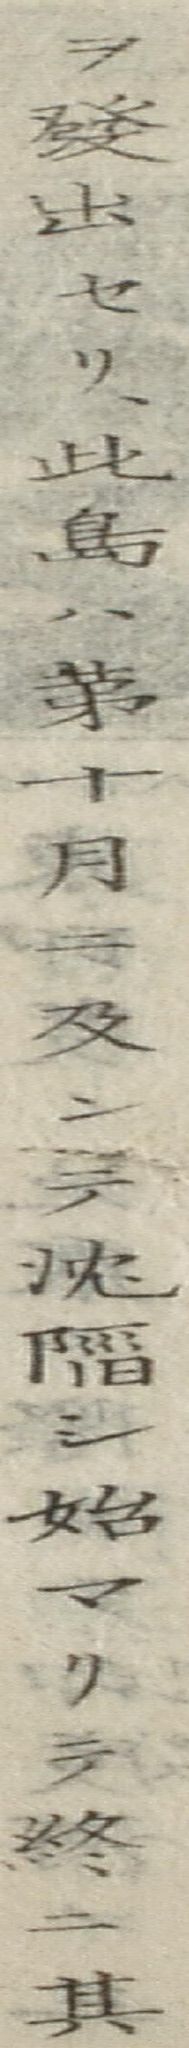ヲ発出セリ、此島ハ第十月ニ及ンテ沈陥シ始マリテ終ニ其
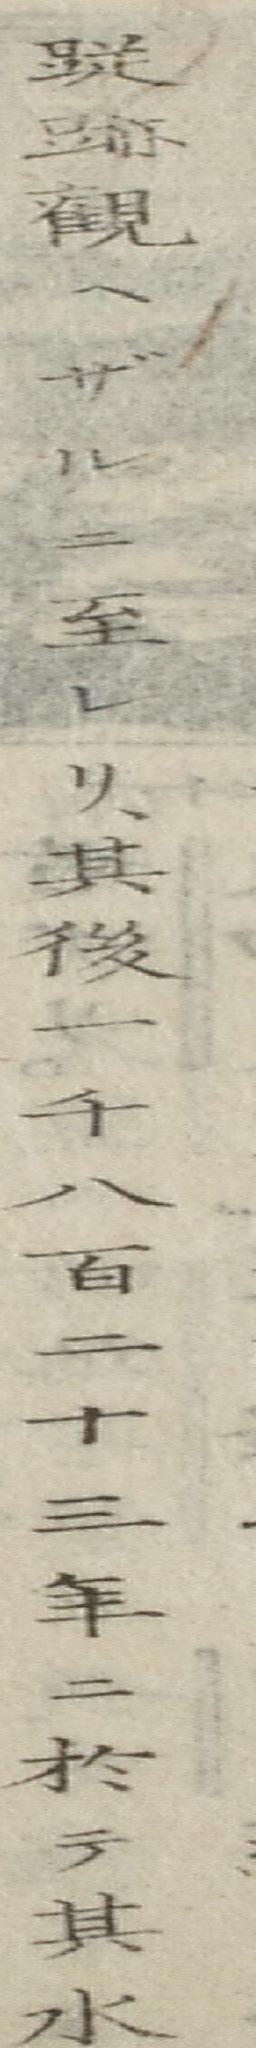蹤跡観ヘザルニ至レリ、其後一千八百二十三年ニ於テ其水
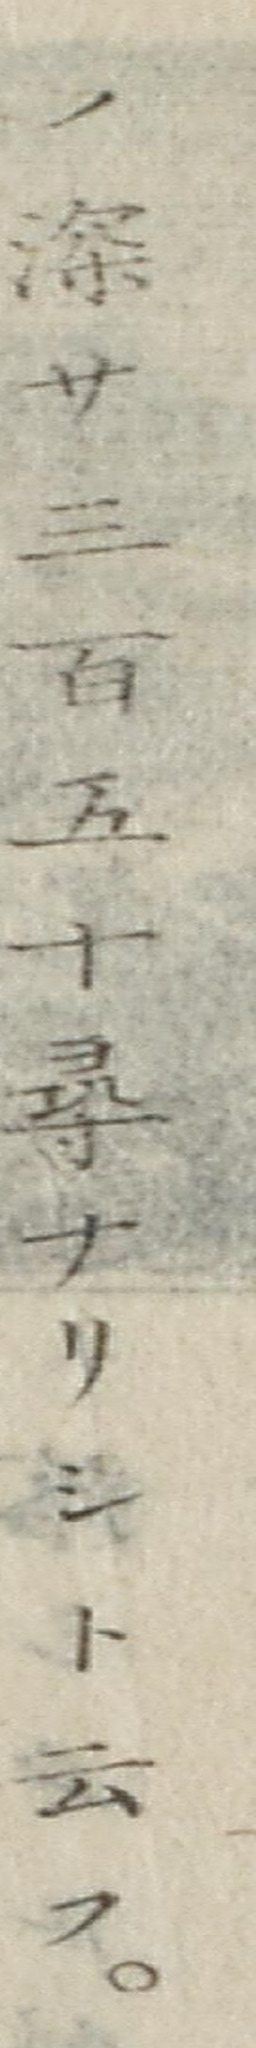ノ深サ三百五十尋ナリシト云フ。
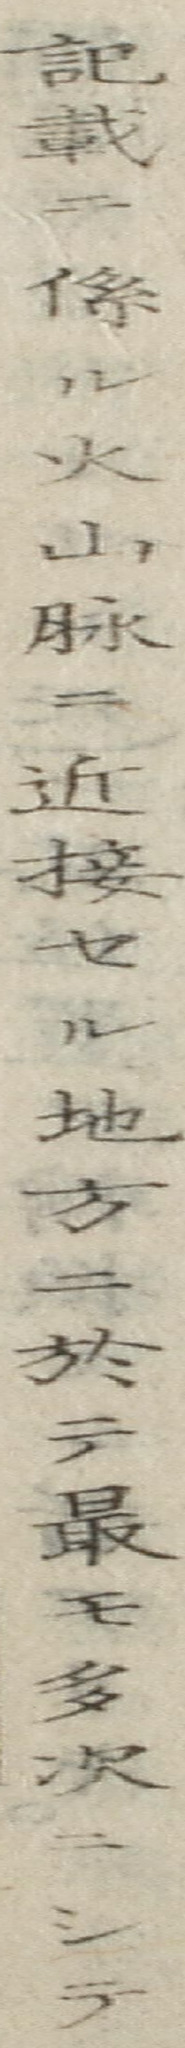記載ニ係ル火山脉ニ近接セル地方ニ於テ最モ多次ニシテ
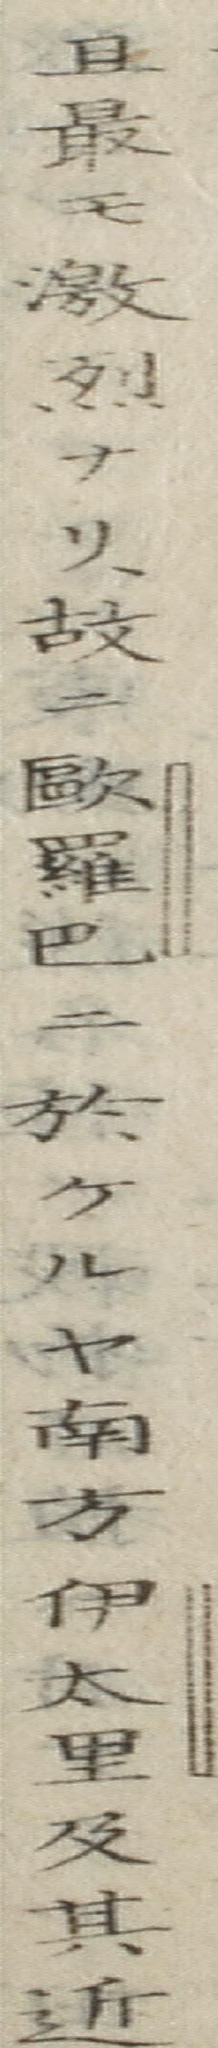且最モ激烈ナリ、故ニ欧羅巴ニ於ケルヤ南方伊太里及其近
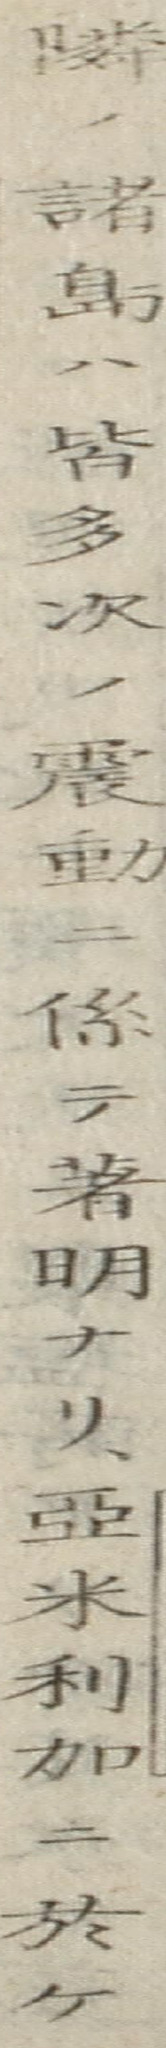隣ノ諸島ハ皆多次ノ震動ニ係テ著明ナリ、亜米利加ニ於ケ
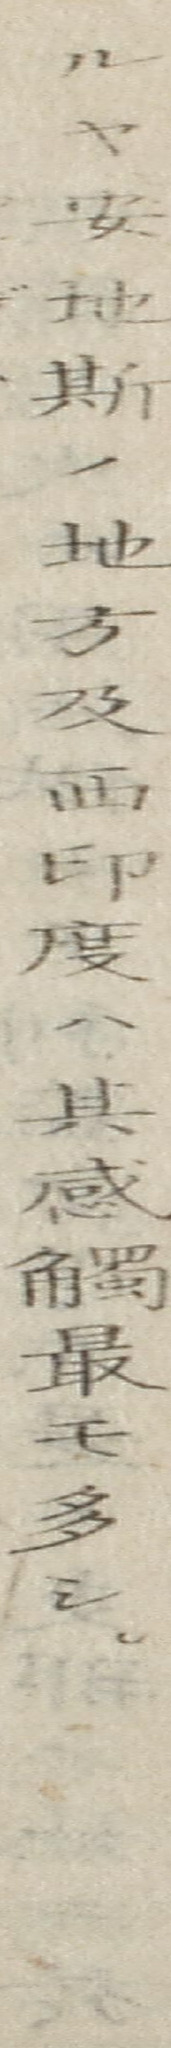ルヤ安地斯ノ地方及西印度ハ其感触最モ多シ。
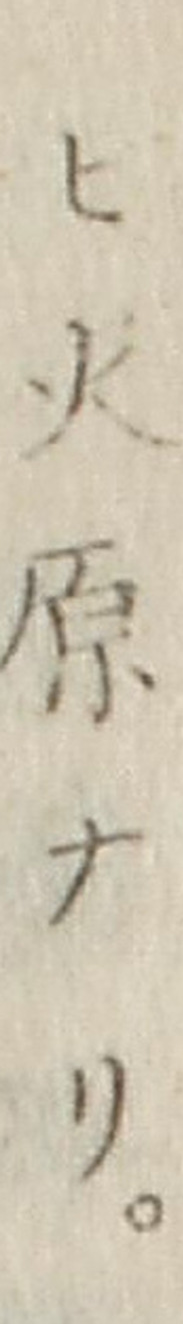ヒ火原ナリ。
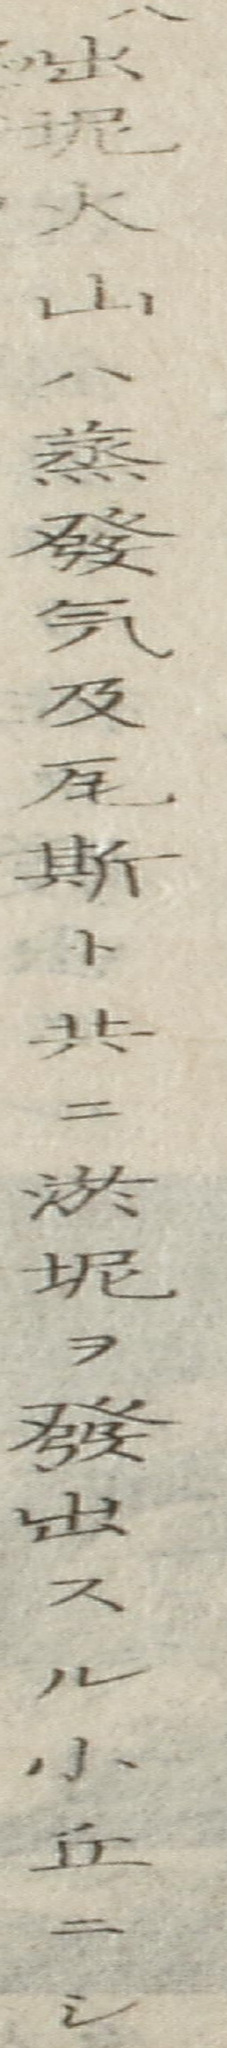卅八出坭火山ハ蒸發気及瓦斯ト共ニ淤坭ヲ発出スル小丘ニシ
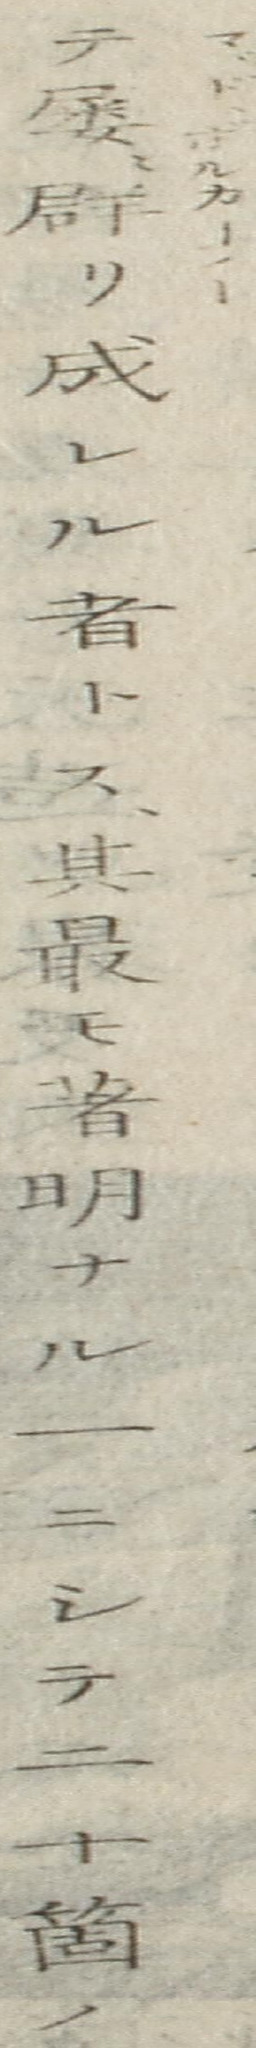テ屡々群リ成レル者トス、其最著明ナル一ニシテ二十箇ノ
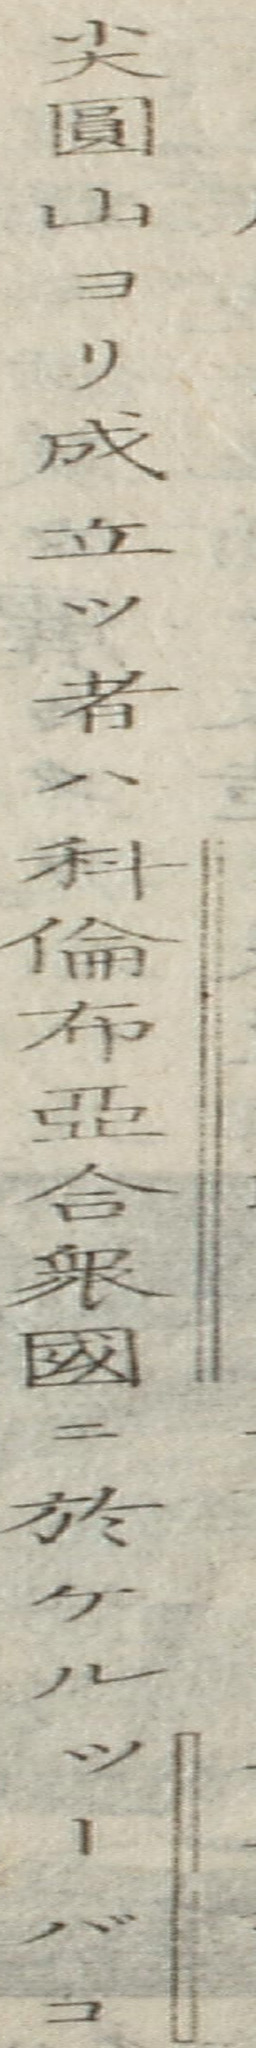尖圓山ヨリ成立ツ者ハ科倫布亜合衆国ニ於ケルツーバコ
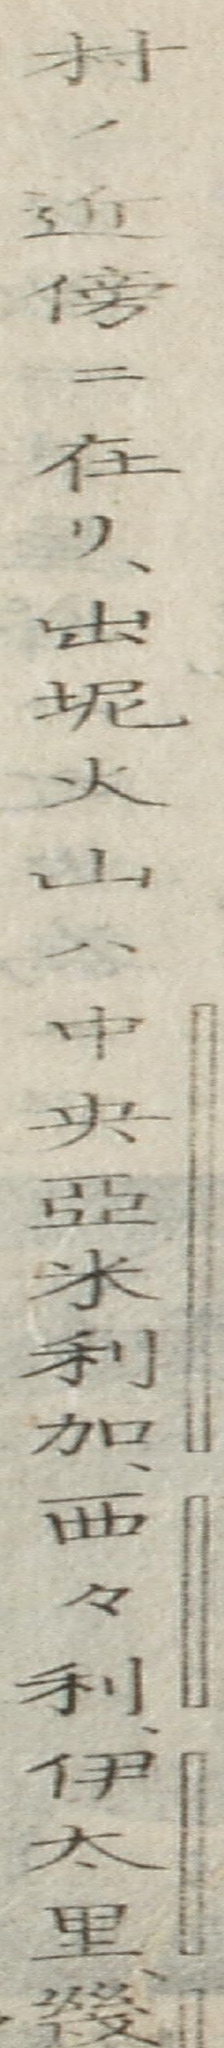村ノ近傍ニ在リ、出坭火山ハ中央亜米利加、西々利、伊太里、幾
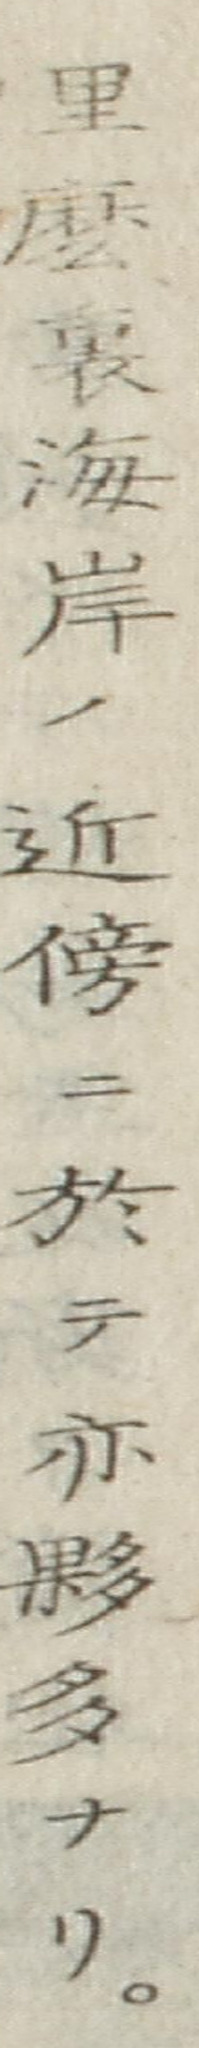里麼裏海岸ノ近傍ニ於テ亦夥多ナリ。
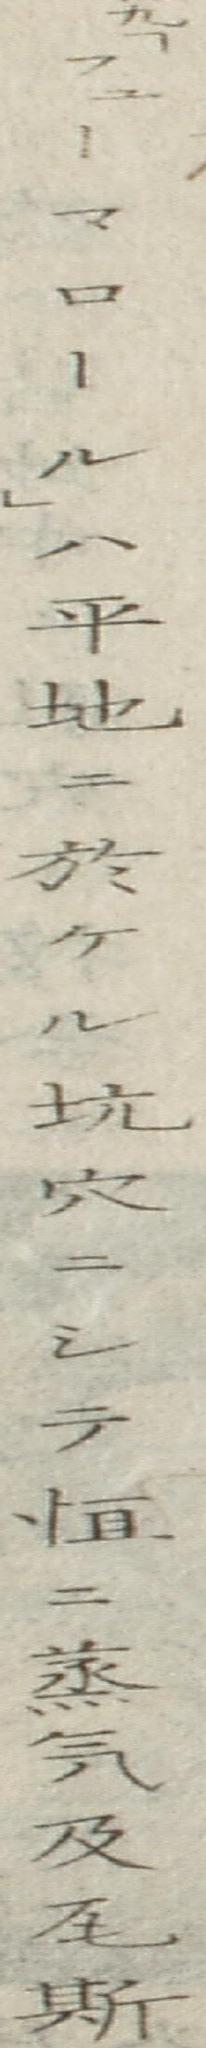卅九「フューマロール」ハ平地ニ於ケル坑穴ニシテ恒ニ蒸気及瓦斯
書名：地形論　巻二
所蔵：東京大学地震研究所図書室 Earthquake Research Institute Library, The University of Tokyo, JAPAN
